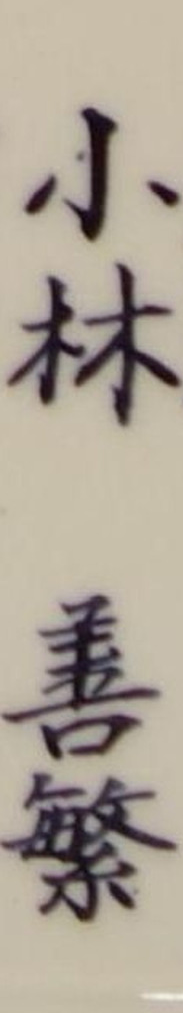小林善繁
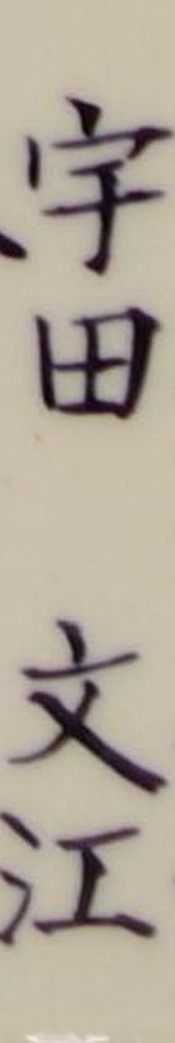宇田文江
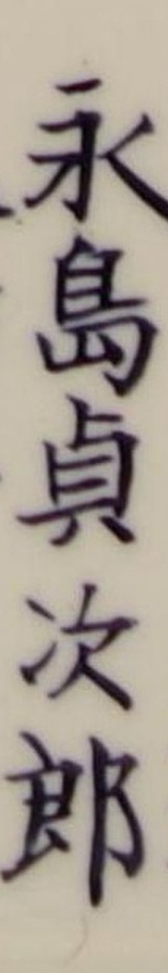永島貞次郎
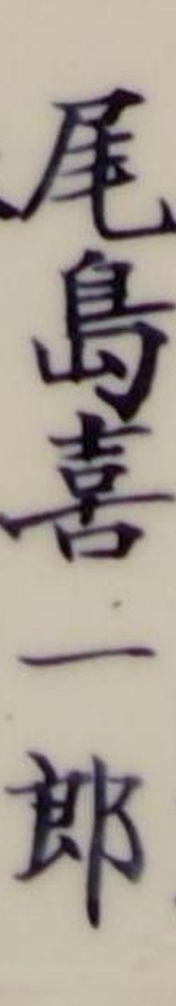尾島喜一郎
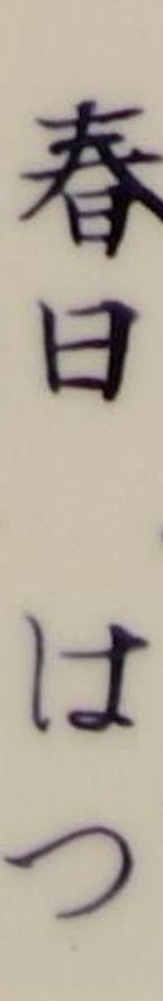春日はつ
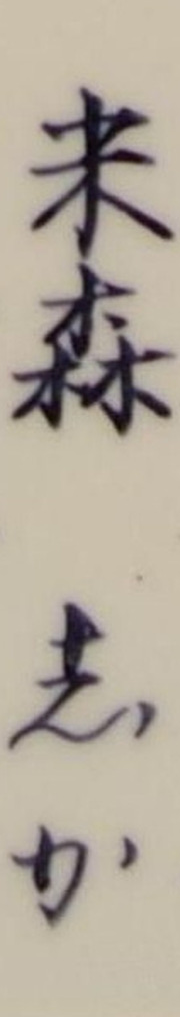米森しか
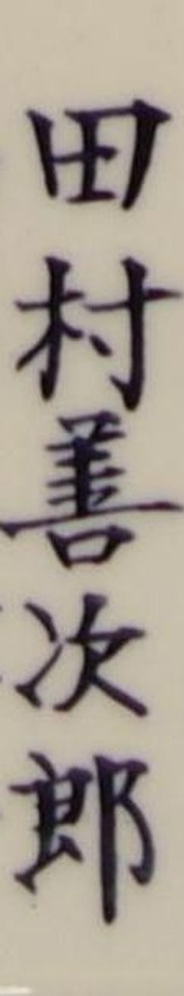田村善次郎
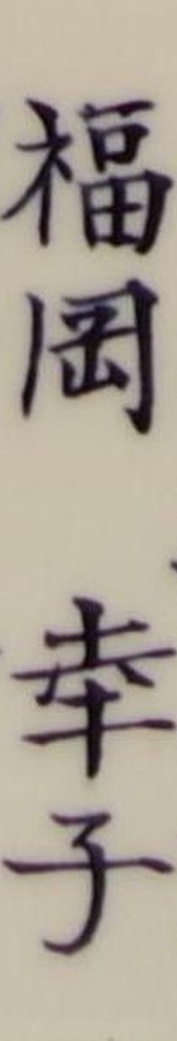福岡幸子
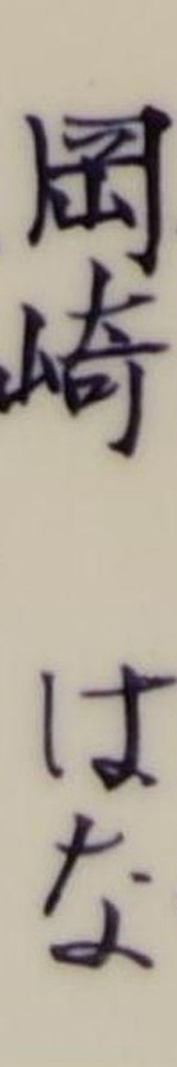岡崎はな
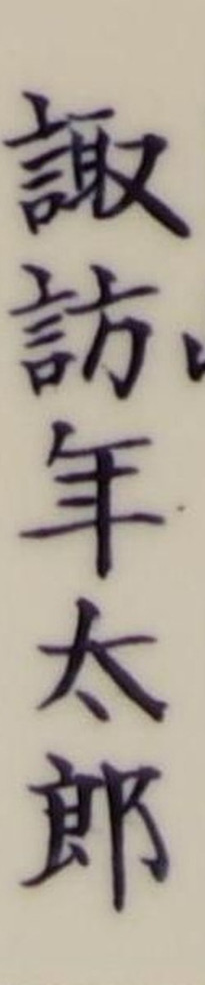諏訪年太郎
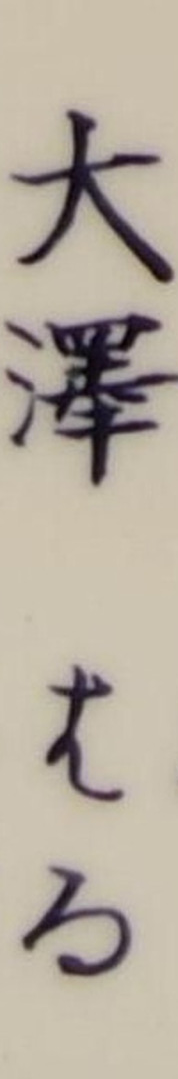大澤はる
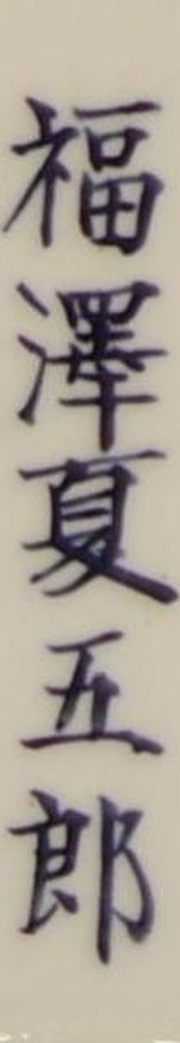福澤夏五郎
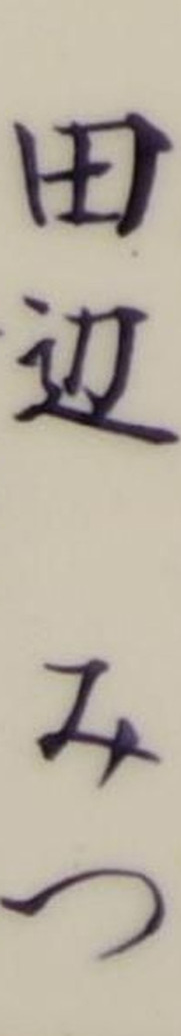田辺みつ
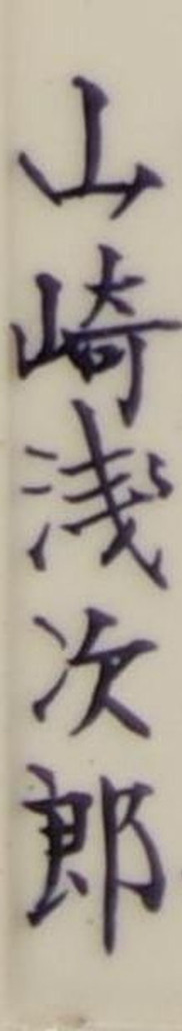山崎浅次郎

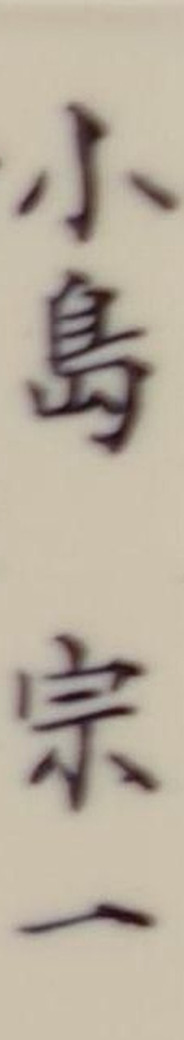小島宗一
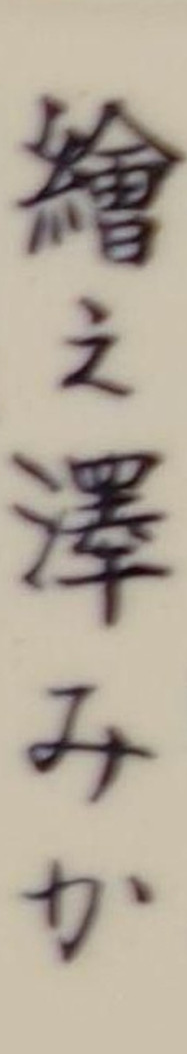絵之澤みか
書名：M~S
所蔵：高野山金剛峯寺
